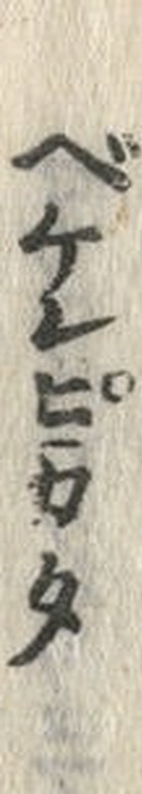巳ベケレピカタ
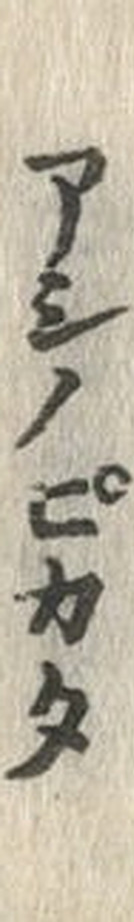未アシノピカタ
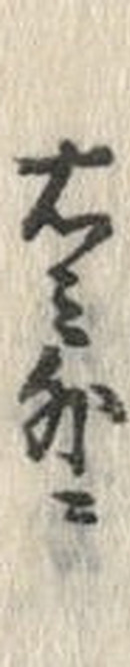右之外ニ
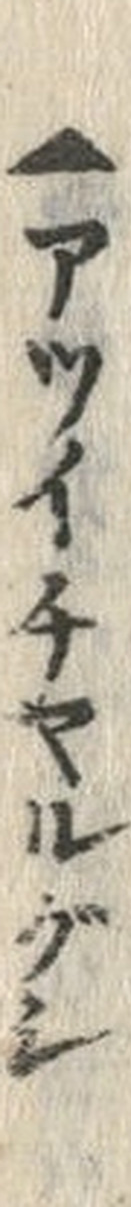▲アツイチヤルグシ

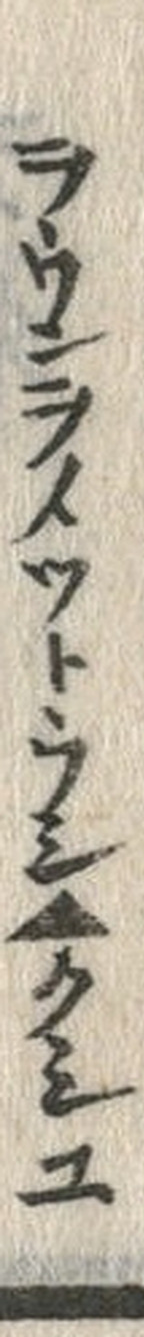ヲウンヲメツトラシ▲クシユ
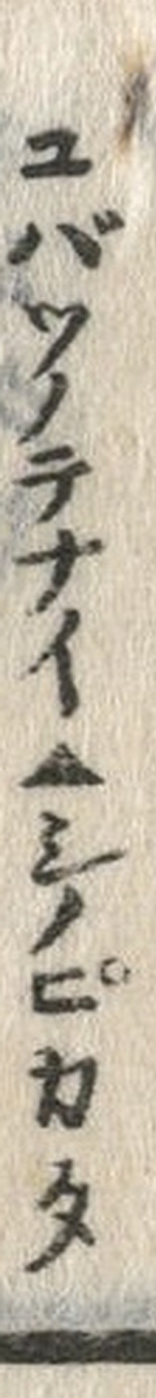ユバツノテナイ▲シノピカタ
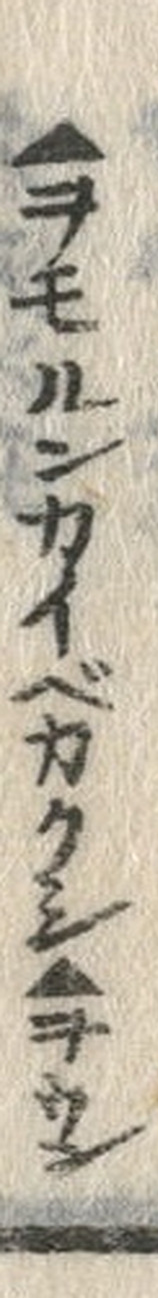▲ヲモルンカイベカクシ▲ヲウン
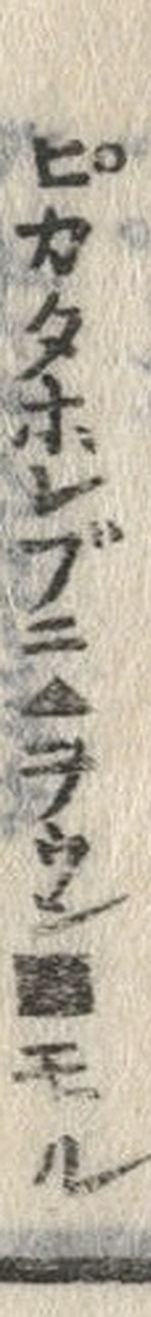ピカタホレブニ▲ヲウンモル
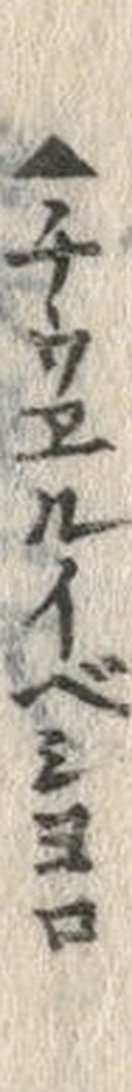▲チウヱルイベシヨロ
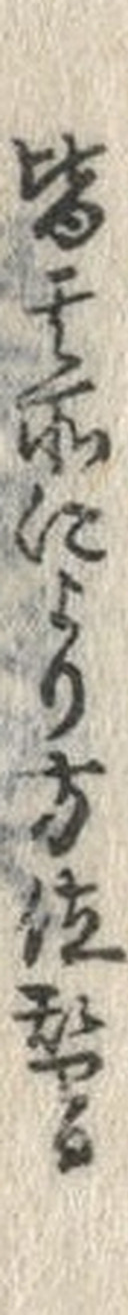皆其所により方位替る
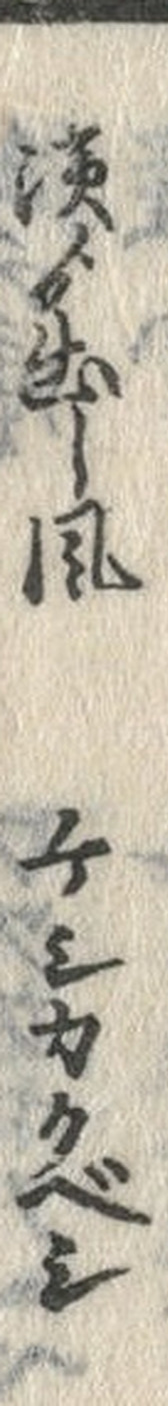浜ゟ出し風ケシカクベシ
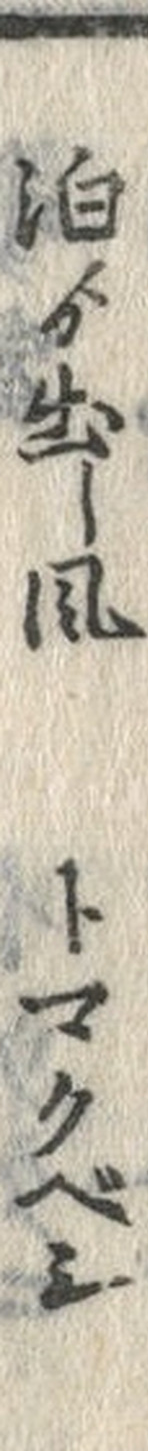泊ゟ出し風トマクベシ
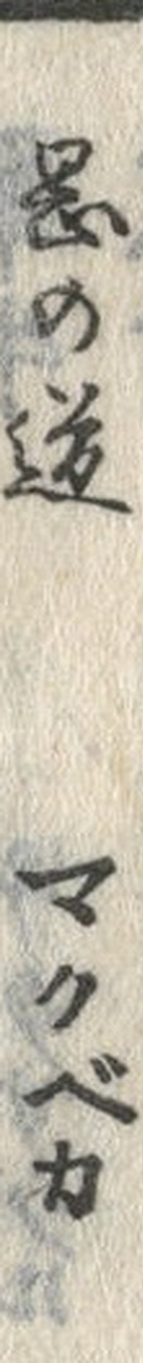岡の道マクベカ
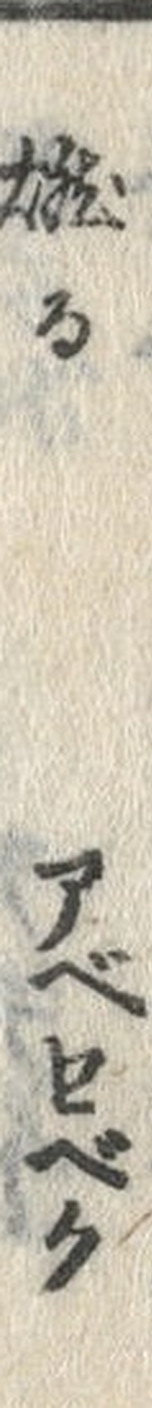燃るアベセベク
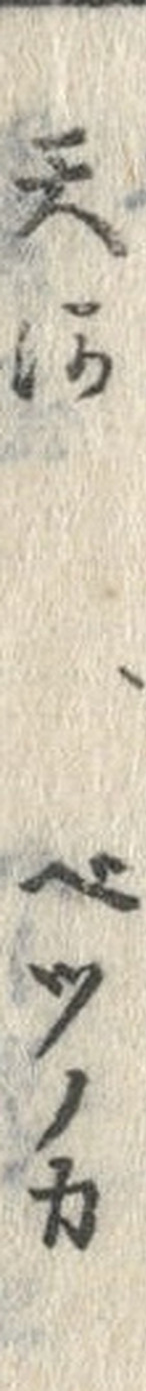天河ベツノカ

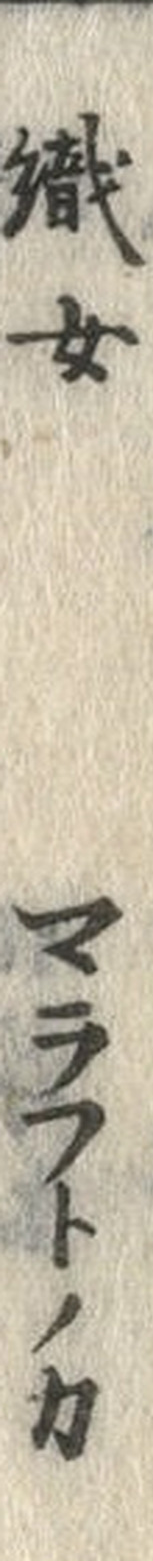織女マラフトノカ
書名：蝦夷方言藻汐草　乾巻
